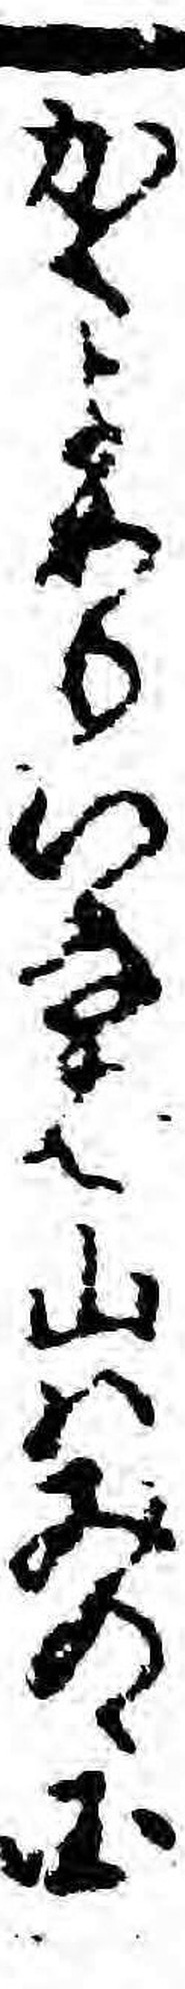かくよめりいなば山はみのゝ国
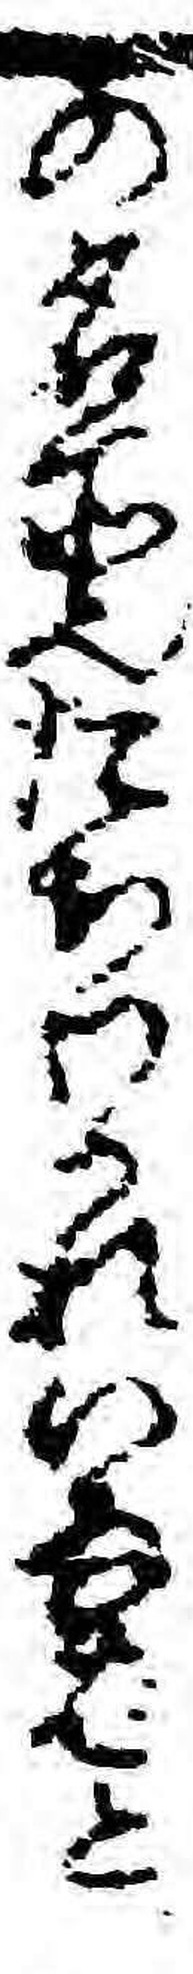の名所也たちわかれいなばと
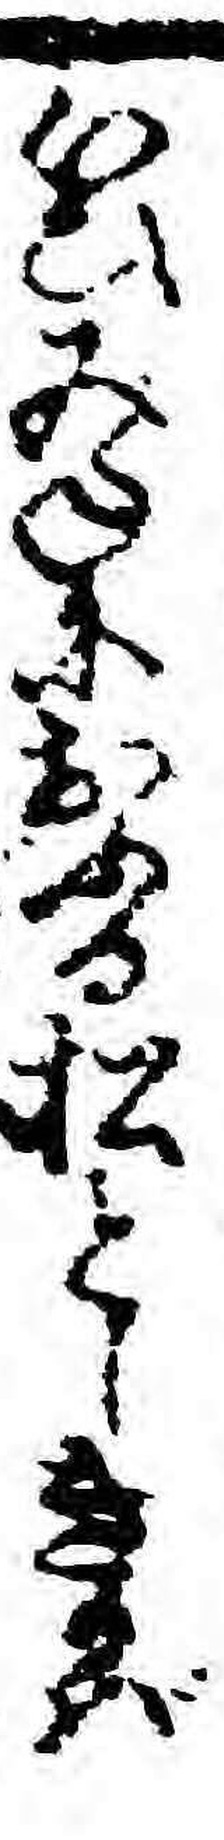いひみねにおふる松としきかば
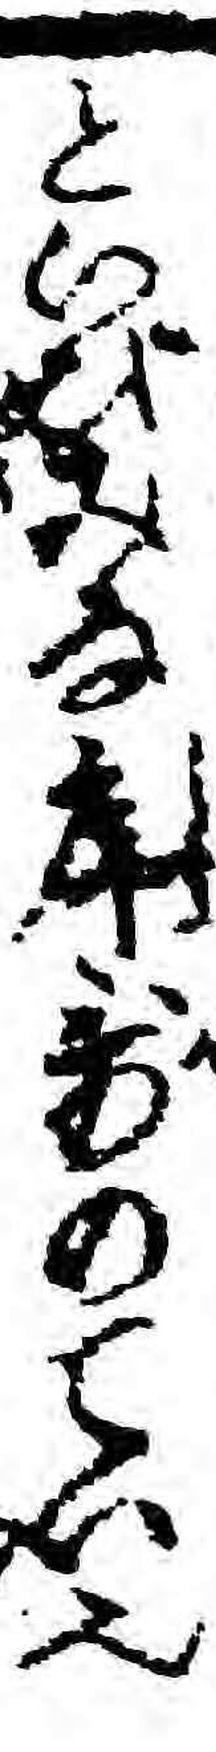といひみな序哥のてい也
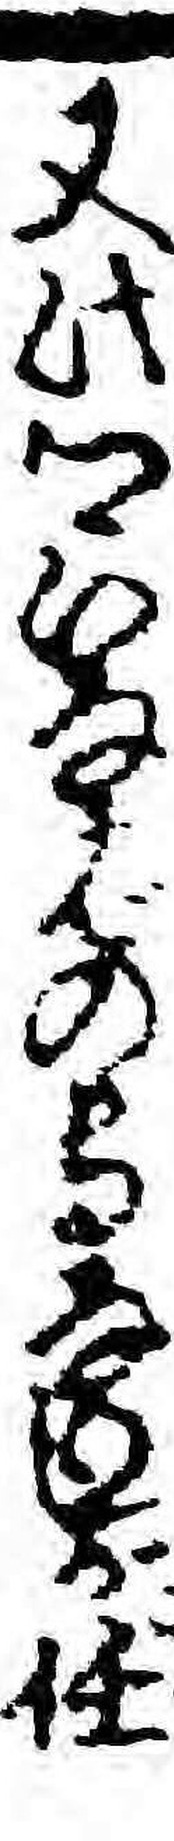又此卿いなばの守なりしが任
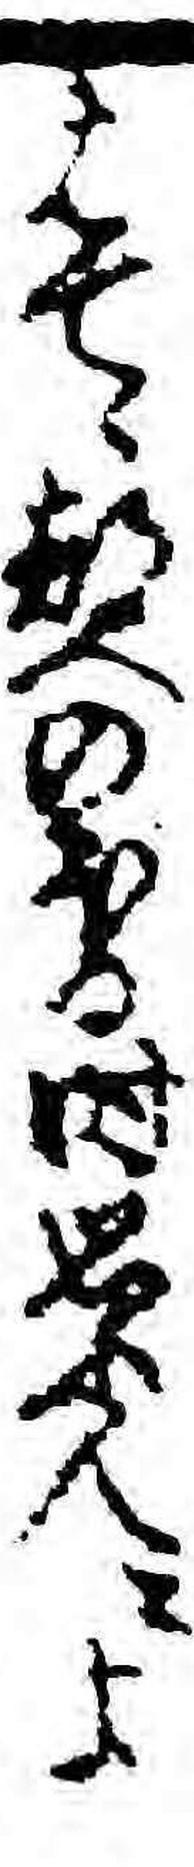はてゝ都へのぼる時思ふ人によ
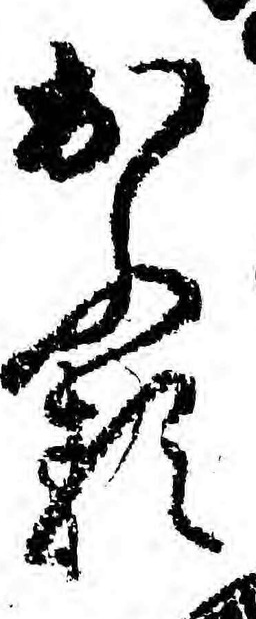おふる
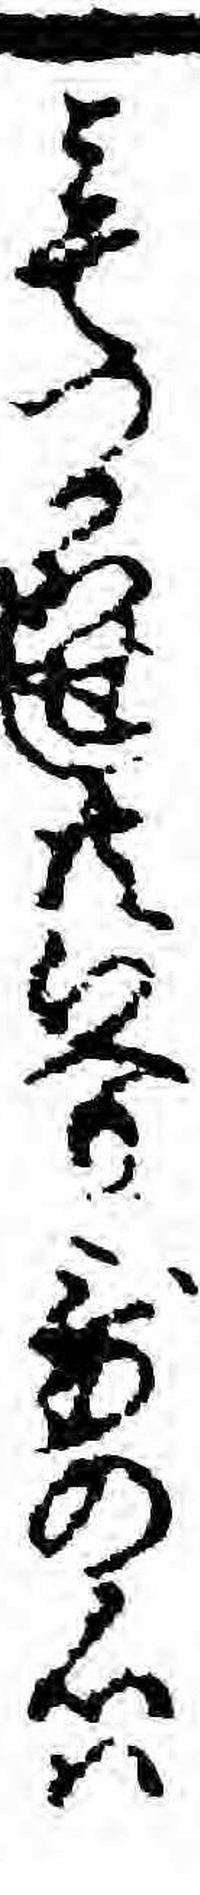みてつかはせし共いへり哥の心は
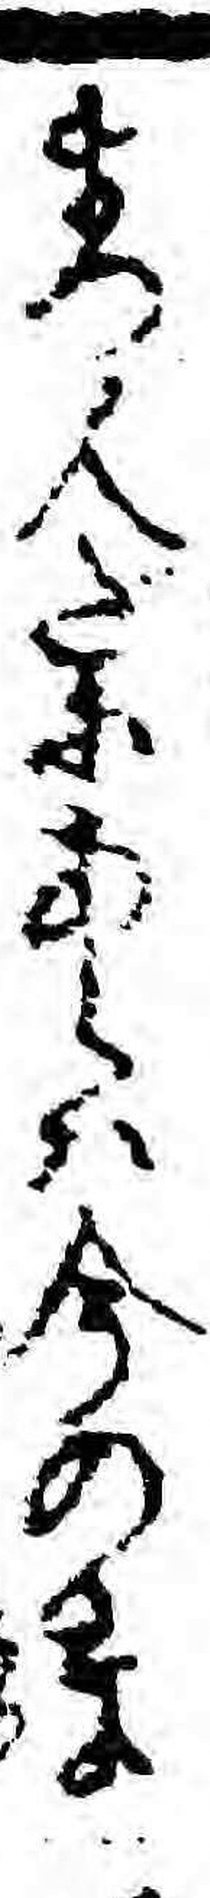まつ人だにあらは今のま
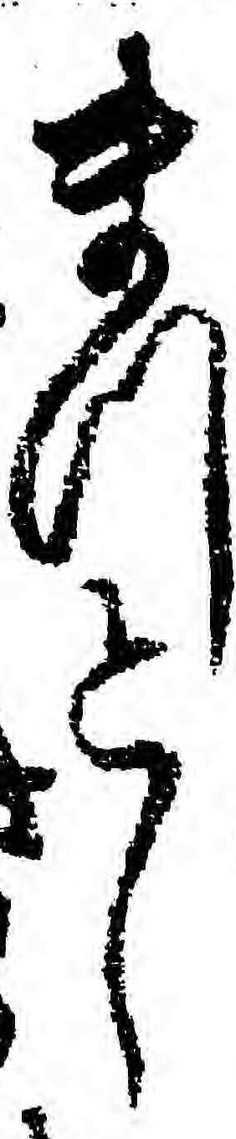まつとし
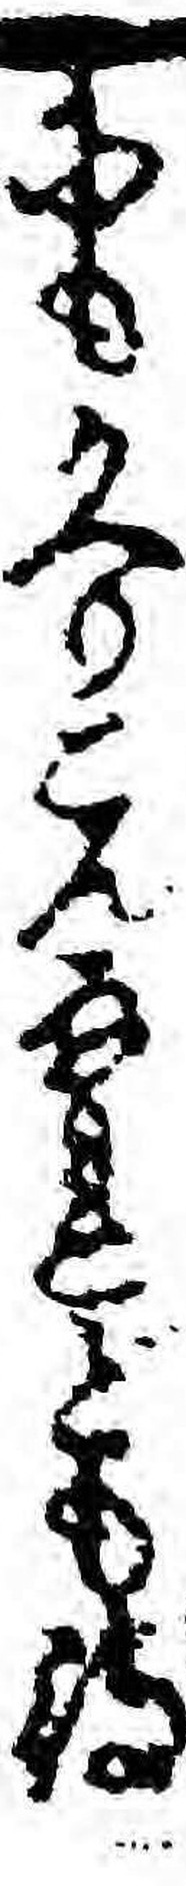にもかへりこんなれども待
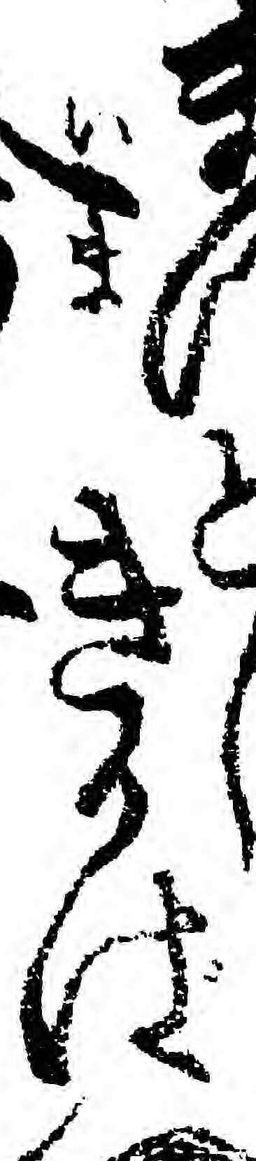きかば
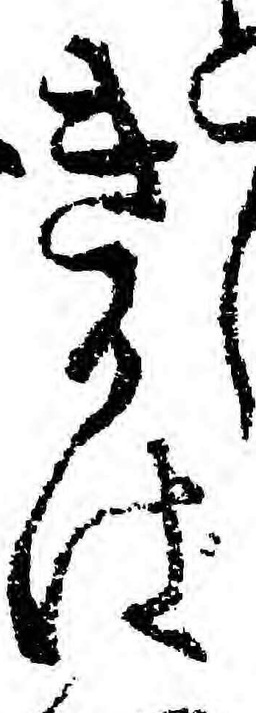きかば
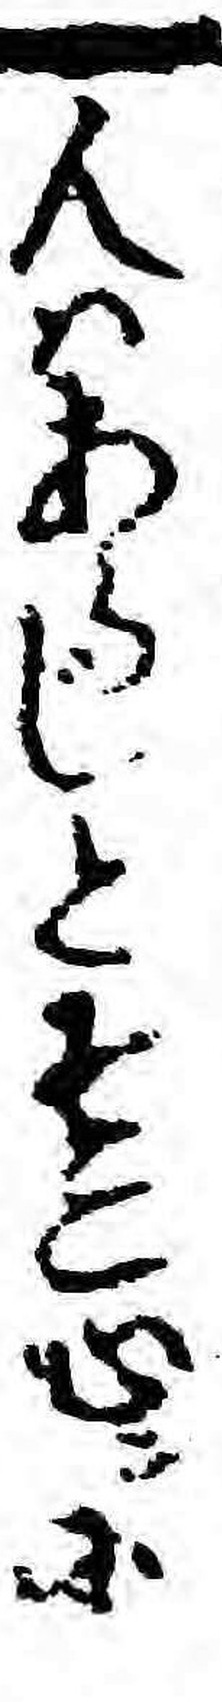人はあらじとそこ心ンに
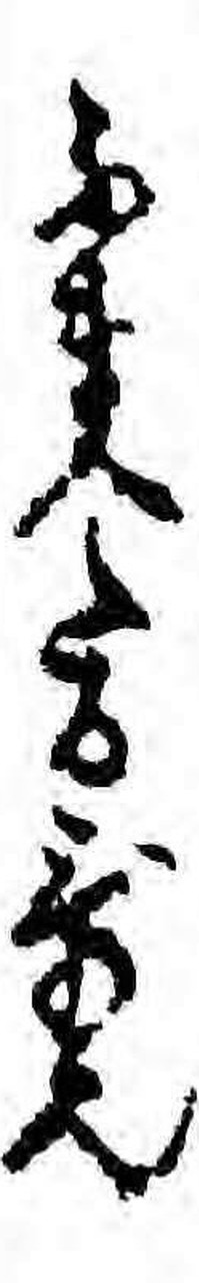ふまへたる哥也
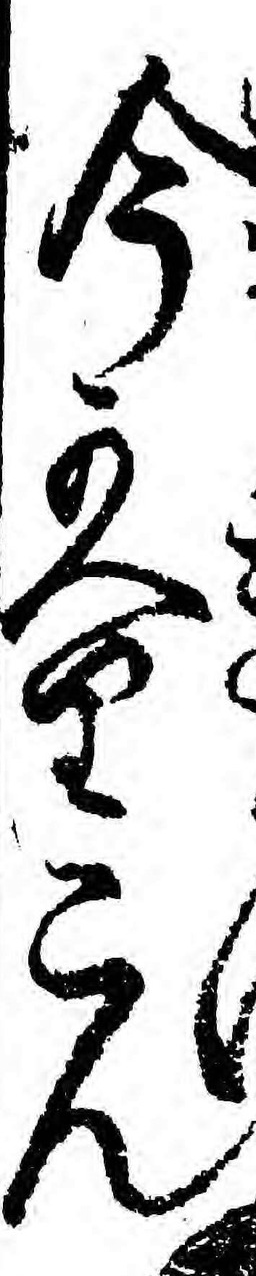今かへりこん
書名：頭書和歌注譯／壽賀多百人一首小倉錦
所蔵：国文学研究資料館
